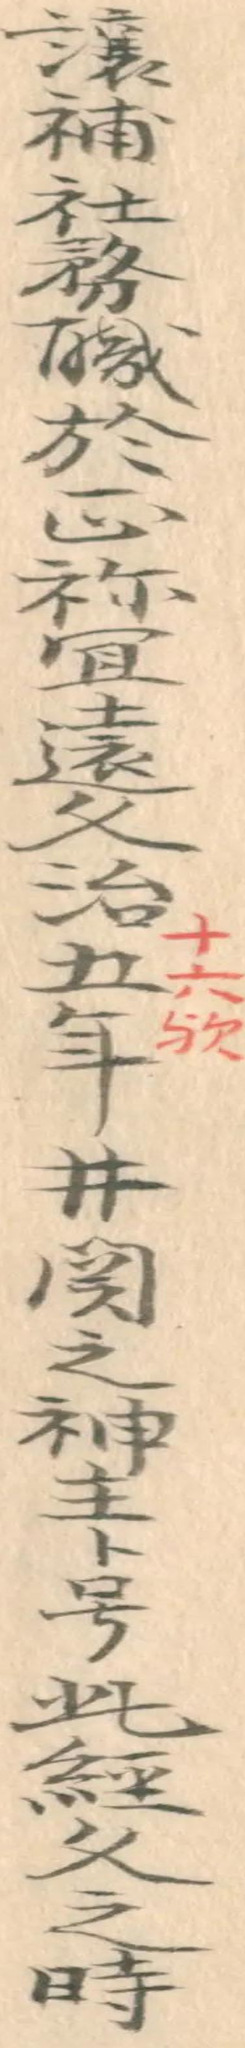譲補社務職於正祢宜遠久治五年井関之神主ト号此経久之時
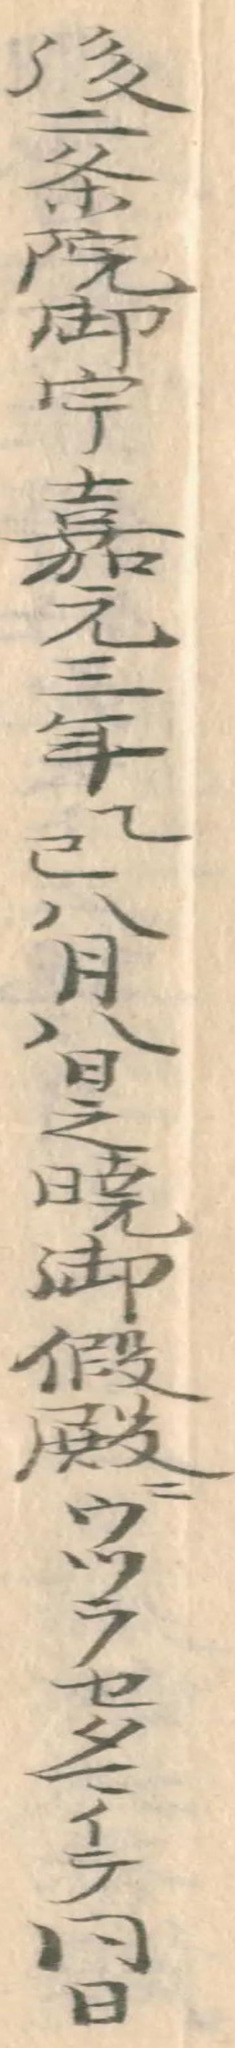後二条院御宇嘉元三年乙巳八月八日之暁御仮殿ニウツラセタマイテ同日
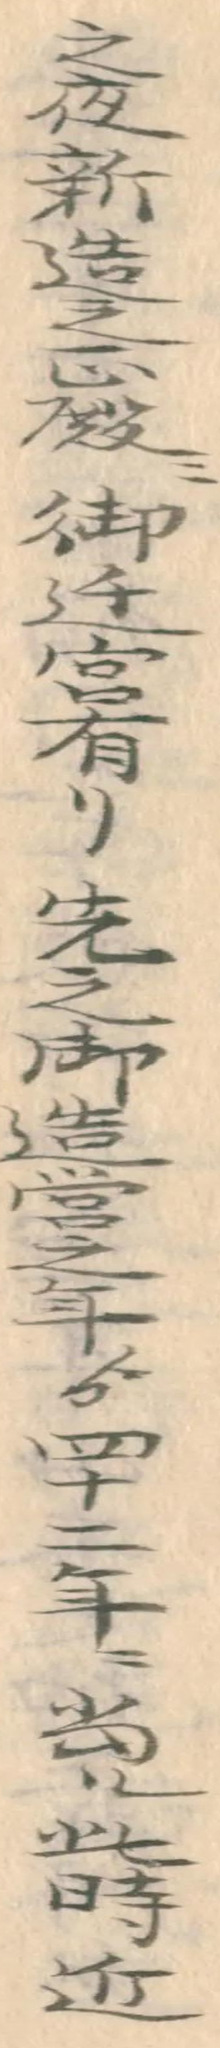之夜新造之正殿ニ御遷宮有り先之御造宮之年ゟ四十二年ニ当ル此時近
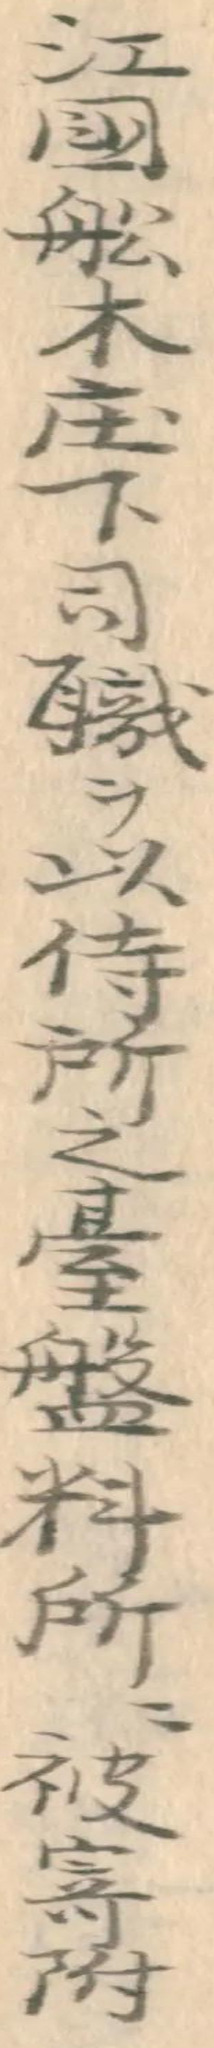江国船木庄下司職ヲ以侍所之台盤料所ニ被寄附
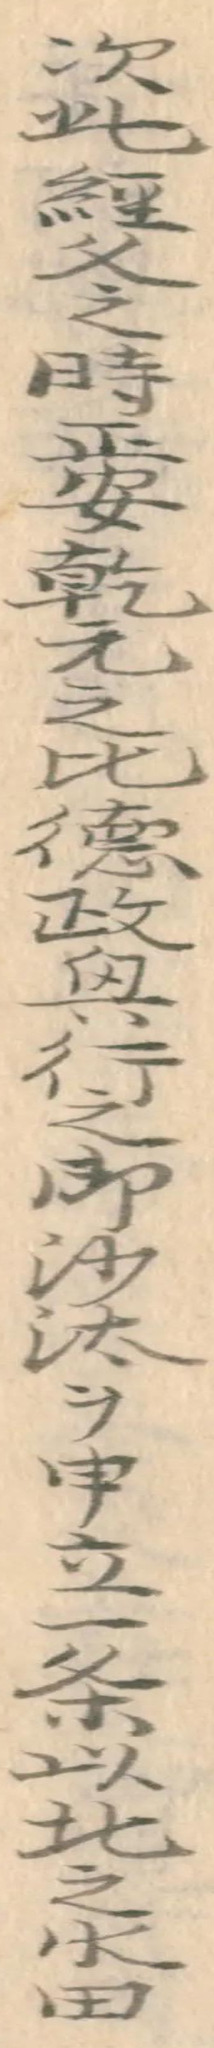次此経久之時正安乾元之頃徳政興行之御沙汰ヲ申立一条以北之水田
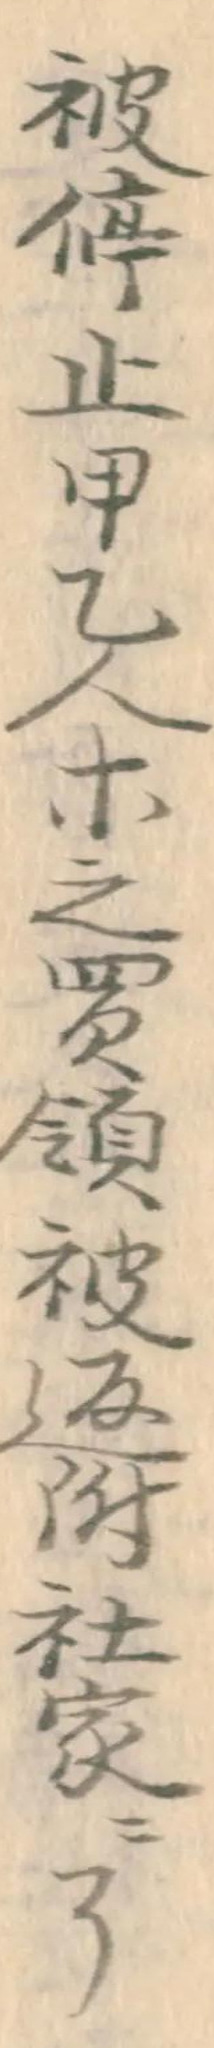被停止甲乙人等之買領被返附社家ニ了
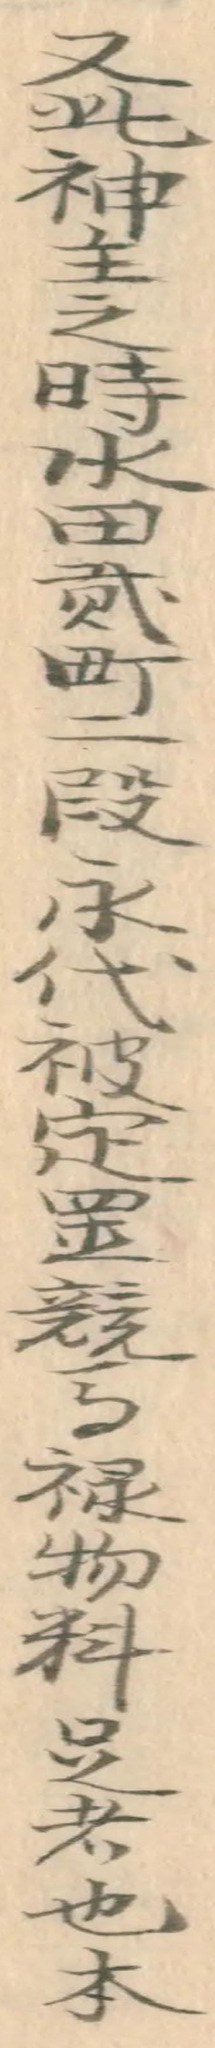又此神主之時水田弐町二段永代被定置競馬禄物料足者也本
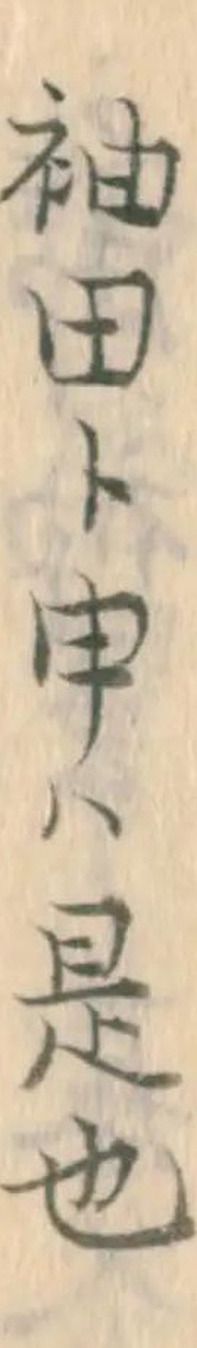袖田ト申ハ是也
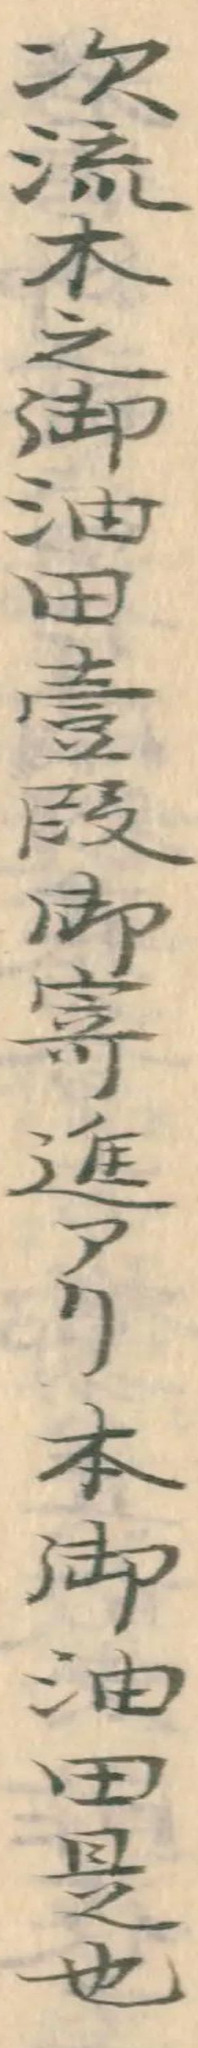次流木之御油田壱段御寄進アリ本御油田是也
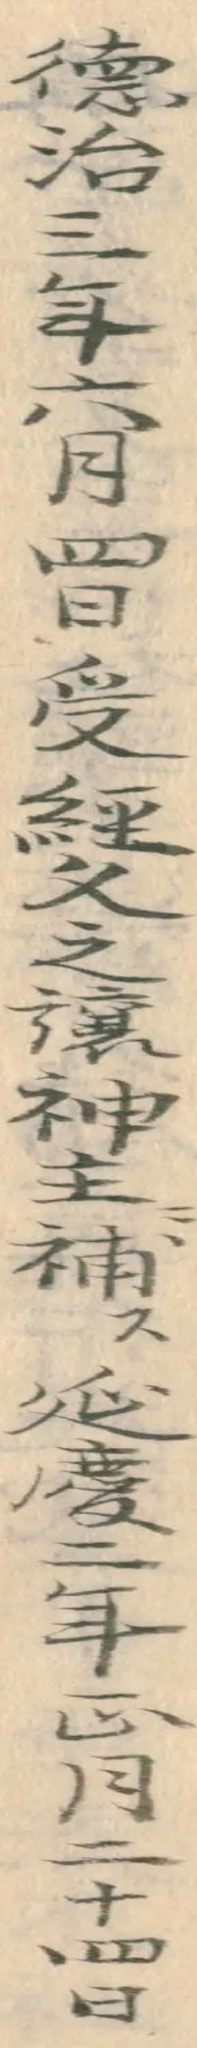徳治三年六月四日受経久之譲神主ニ補ス延慶二年正月二十四日
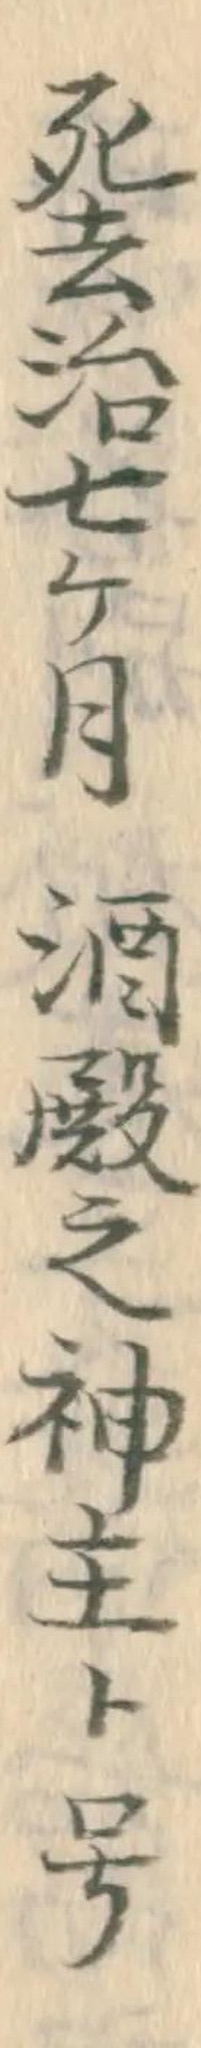死去治七ケ月酒殿之神主ト号
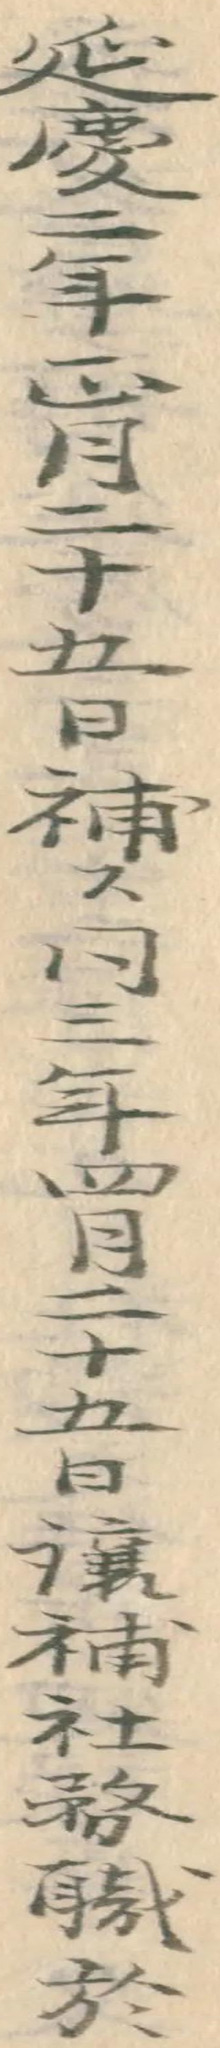延慶二年正月二十五日補ス同三年四月二十五日譲補社務職於
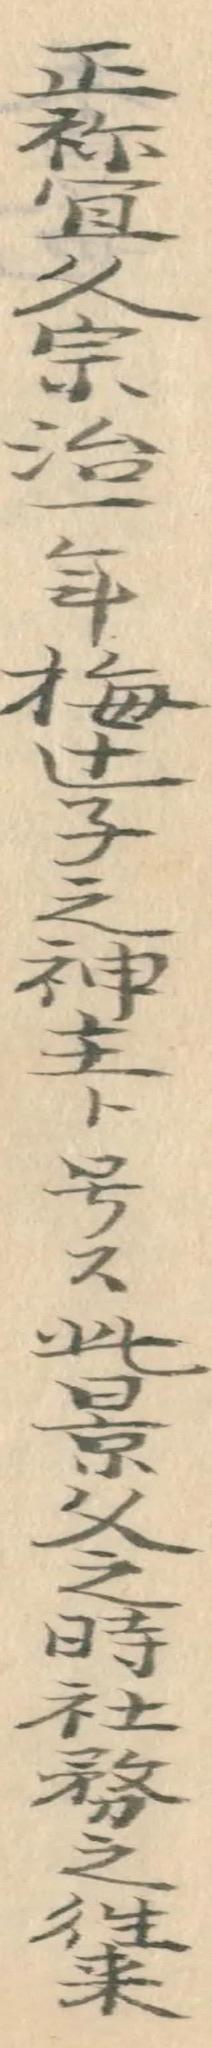正祢宜久宗治一年梅辻子之神主ト号ス此景久之時社務之往来
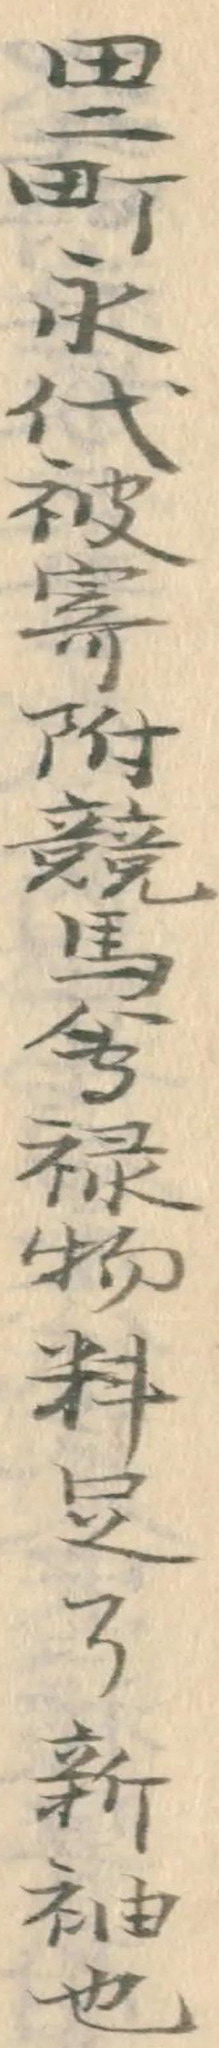田二町永代被寄附競馬会禄物料足了新袖也
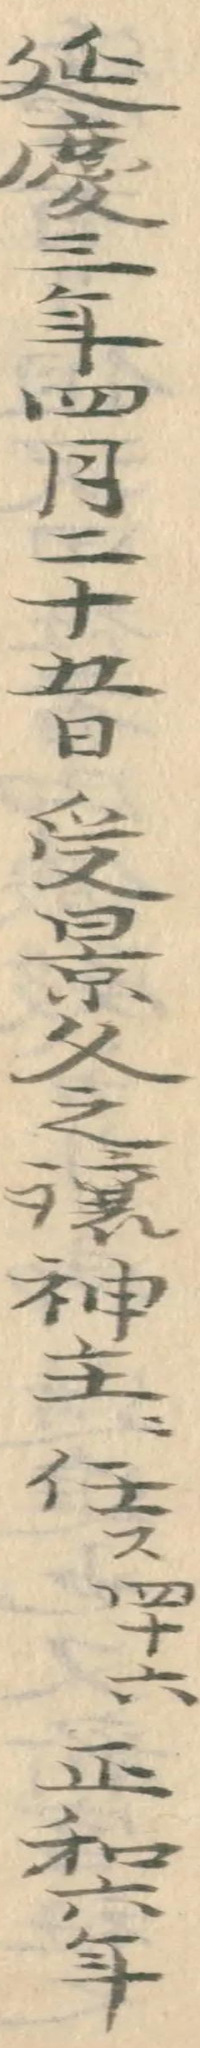延慶三年四月二十五日受景久之譲神主ニ任ス四十六正和六年
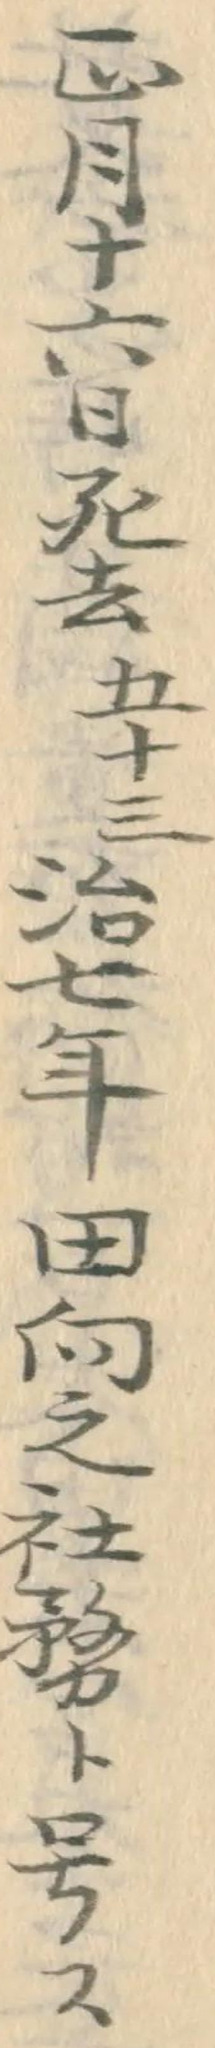正月十六日死去五十三治七年田向之社務ト号ス
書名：賀茂社記録. 第24冊
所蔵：国立国会図書館 National Diet Library, JAPAN
